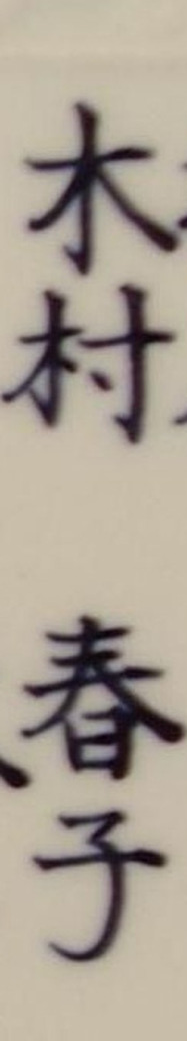木村春子
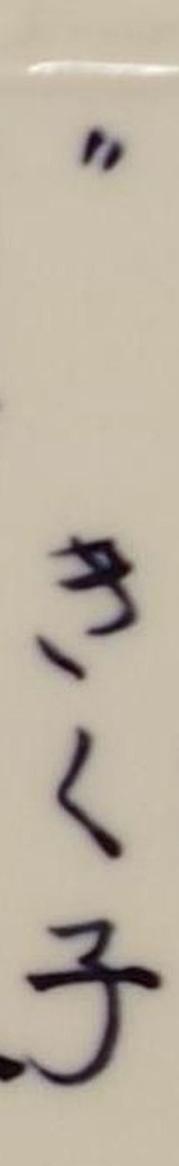きく子
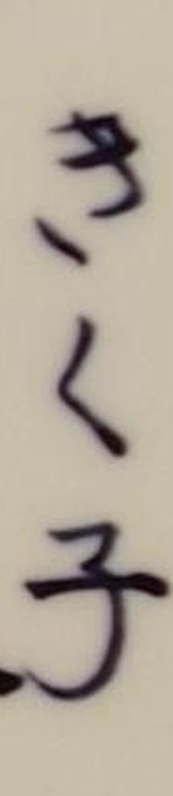きく子
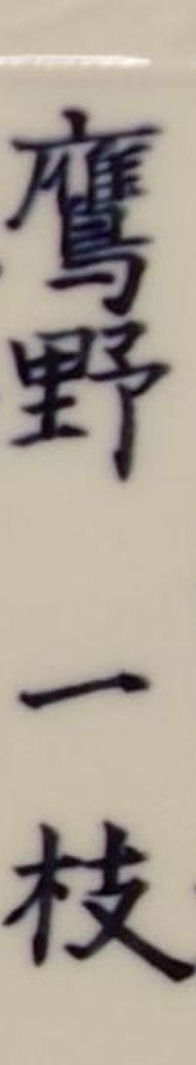鷹野一枝
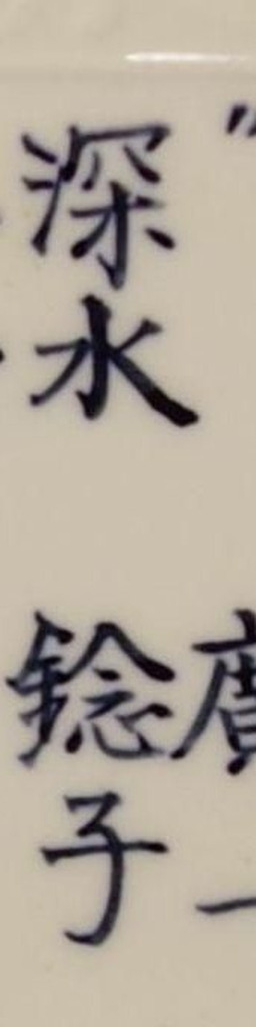深水錜子
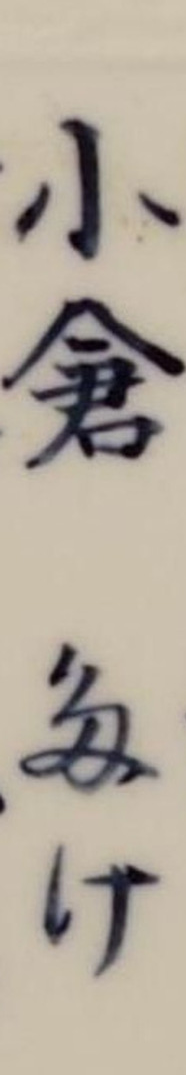小倉たけ
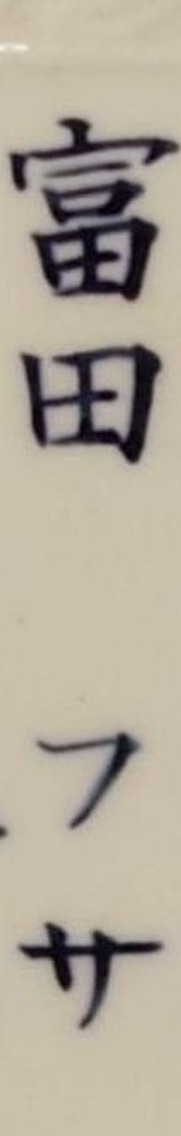富田フサ
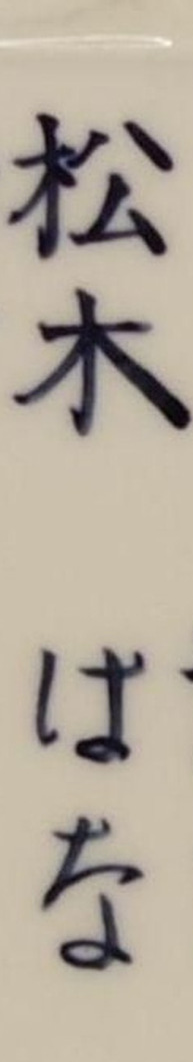松木はな
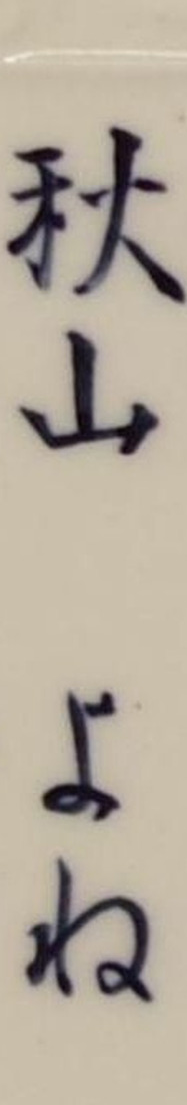秋山よね
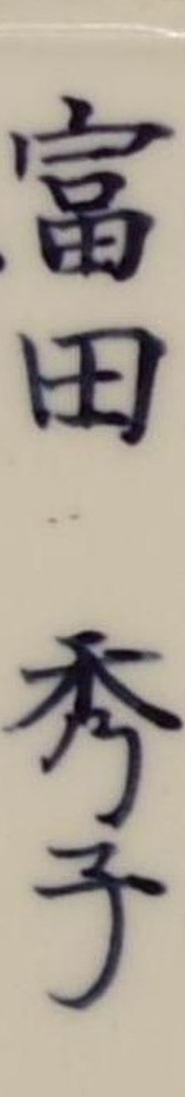富田秀子
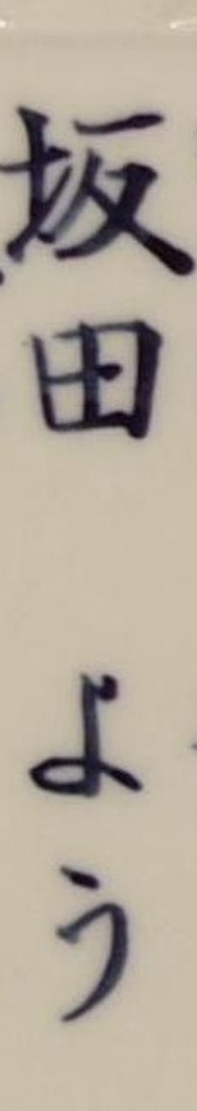坂田よう
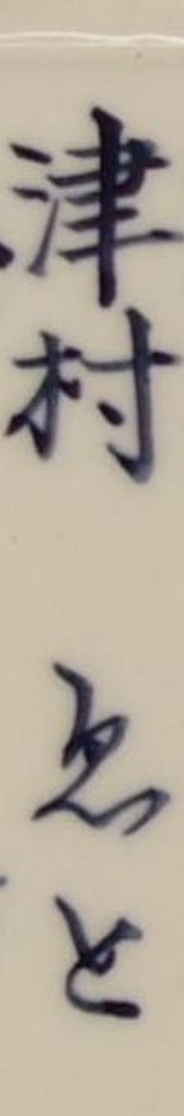津村えと
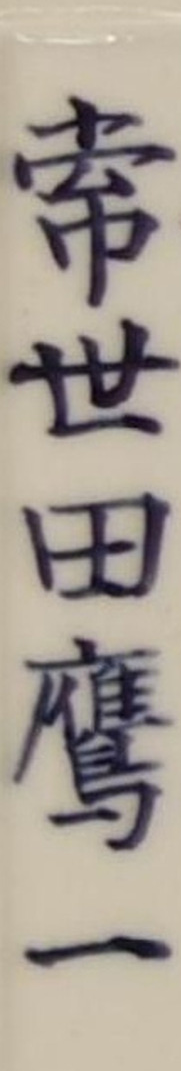常世田鷹一

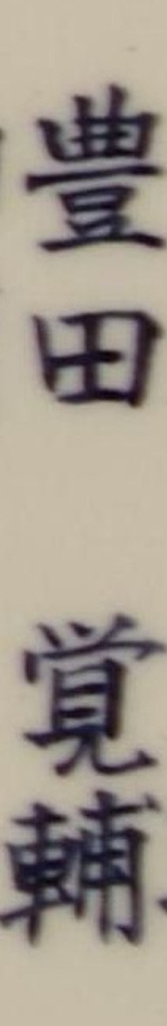豊田覚輔
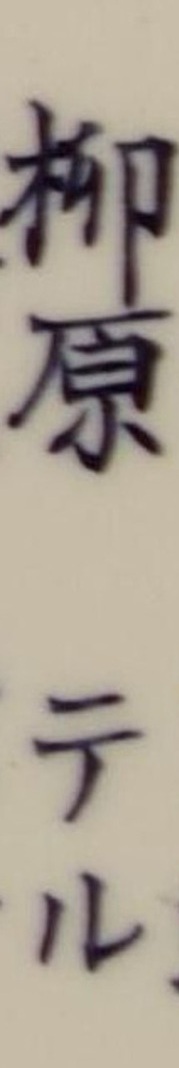柳原テル
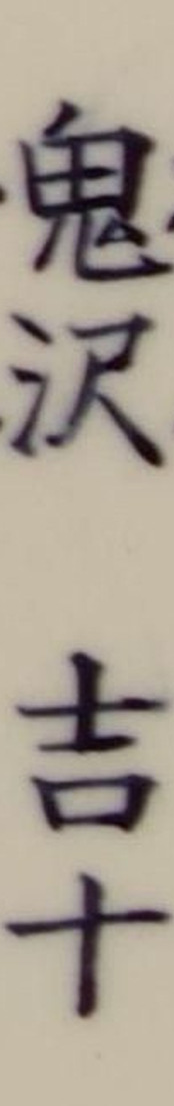鬼沢吉十
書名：E~L
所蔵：高野山金剛峯寺
